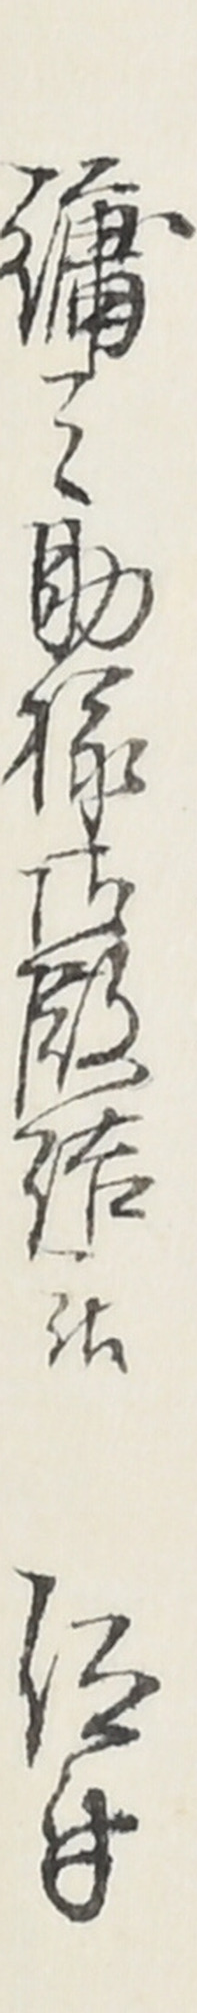鏞之助様御殿詰被仰付
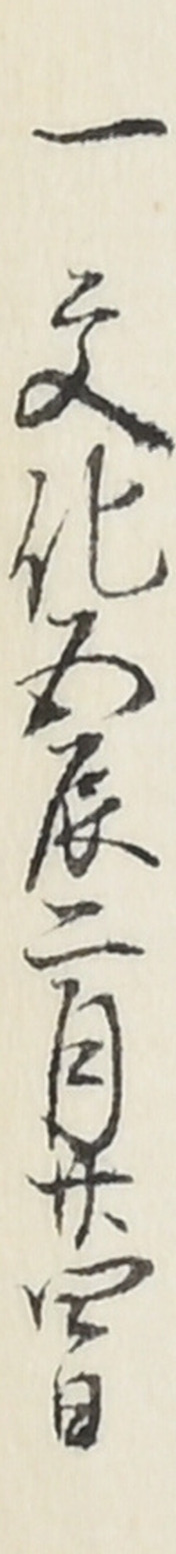一文化五辰二月廿四日
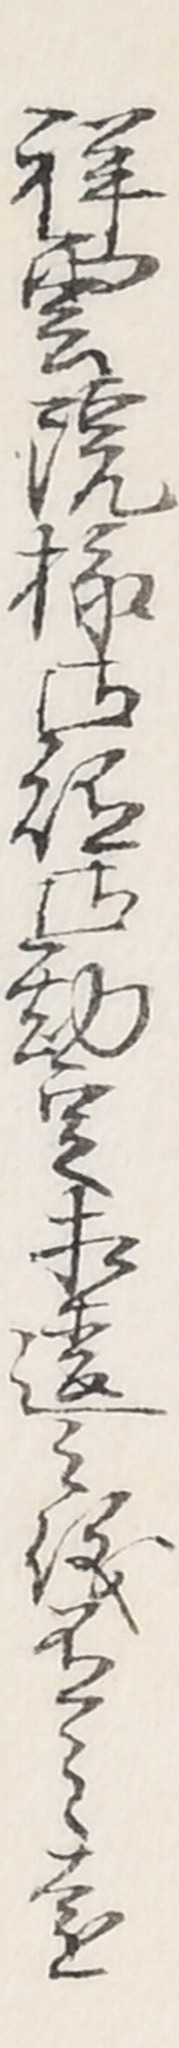祥雲院様御賄御勘定相違之儀有之遠
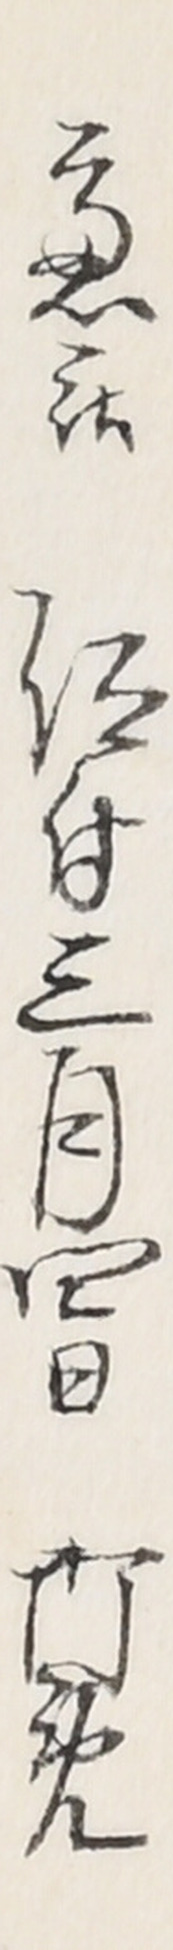慮被仰付三月四日御免
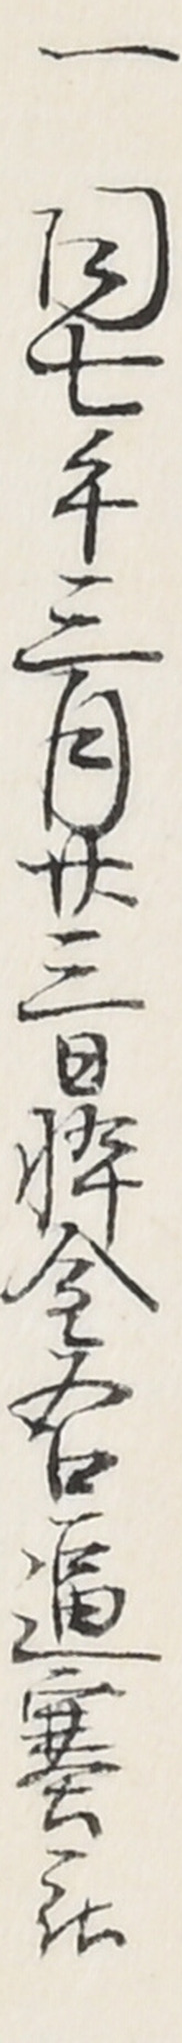一同七午三月廿三日忰金吾逼塞被
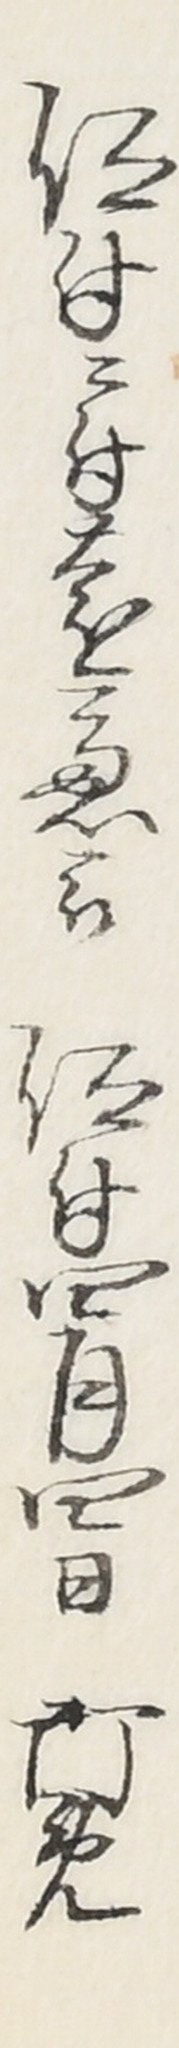仰付ニ付遠慮被仰付四月四日御免
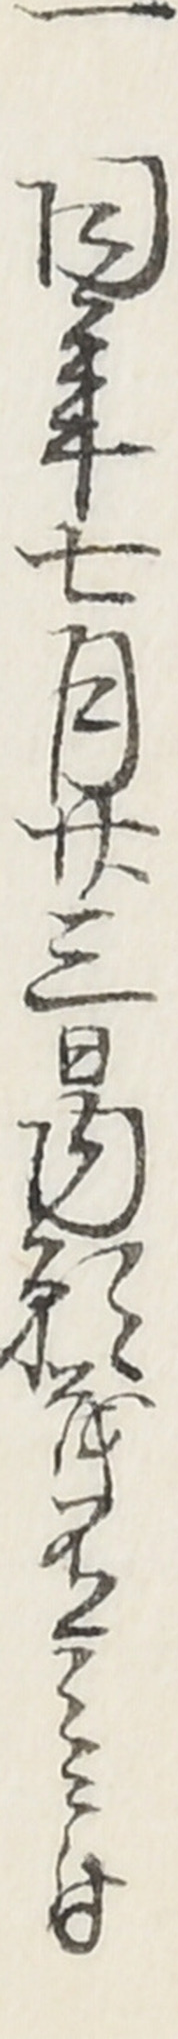一同年七月廿三日内願茂有之ニ付
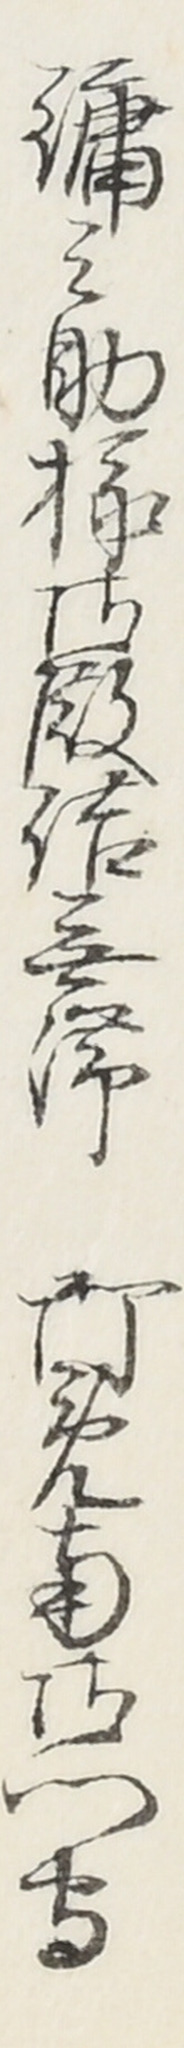鏞之助様御殿詰無滞御免南御門守
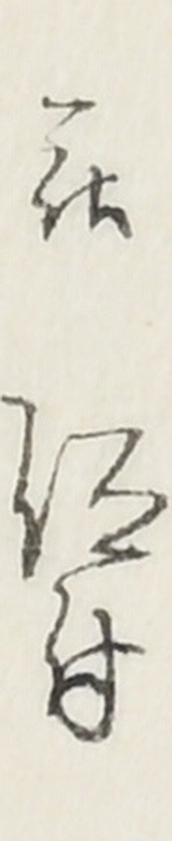被仰付
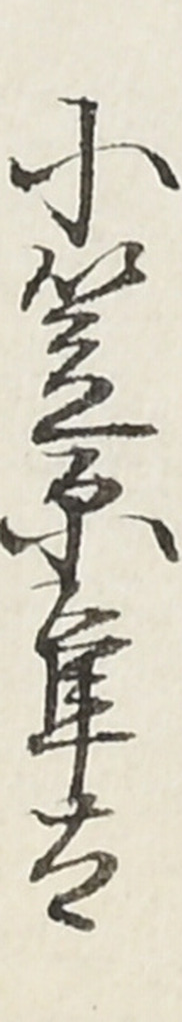小笠原隼太
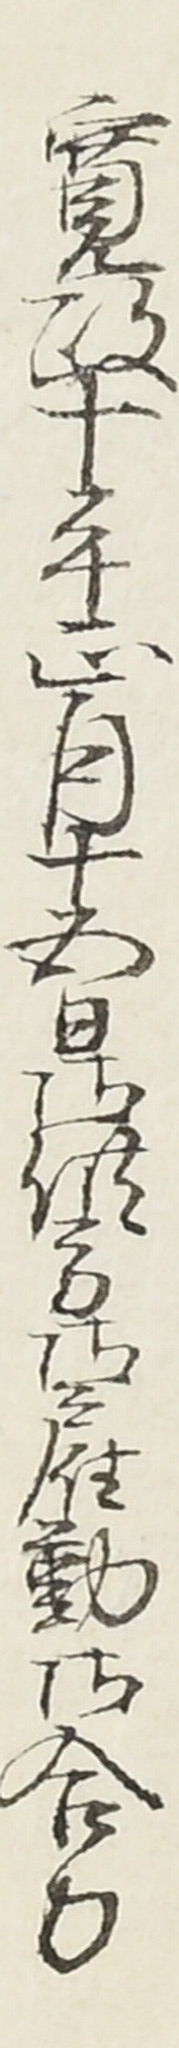一寛政十午正月十五日御供方御雇勤御合力
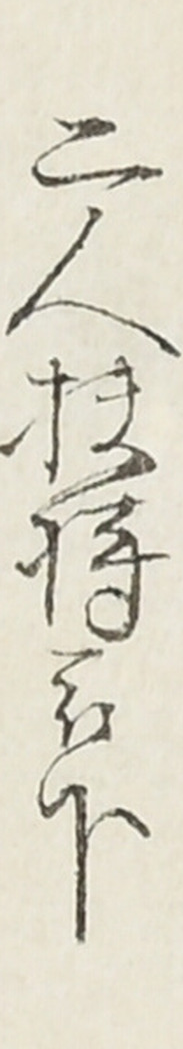二人扶持被下
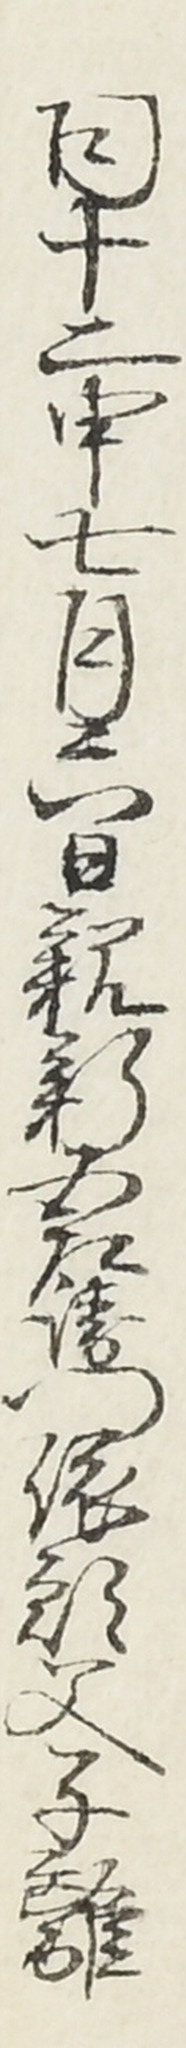一同十二申七月六日親新五左衛門依願父子離
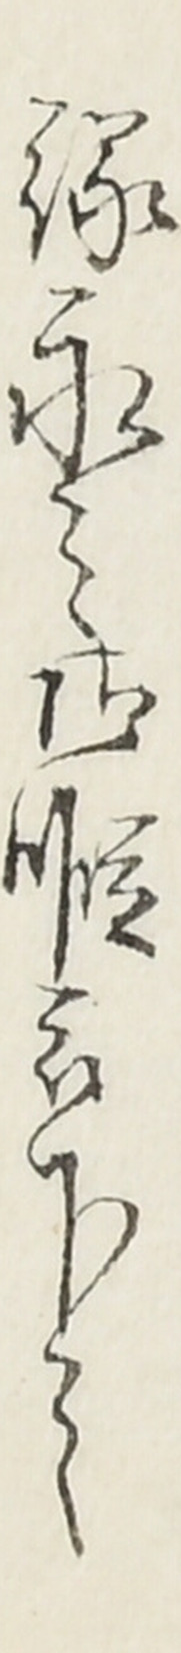縁永之御暇被下之

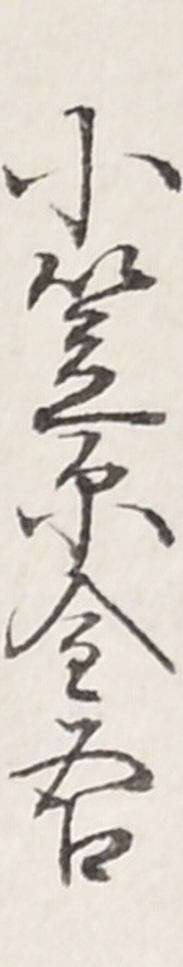小笠原金吾
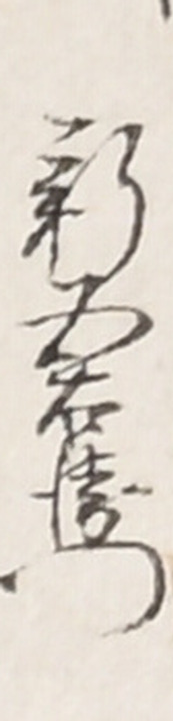新五右衛門
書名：無足諸士勤仕録（四）
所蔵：伊那市立高遠町図書館・合同会社AMANE
